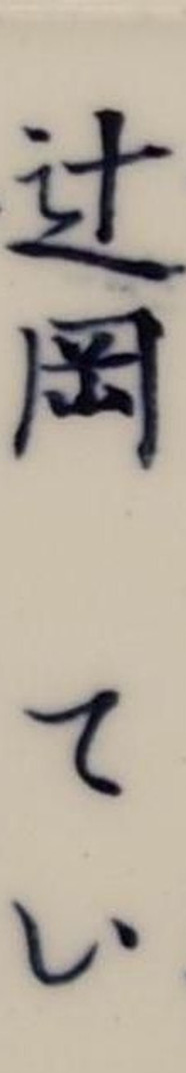辻岡てい
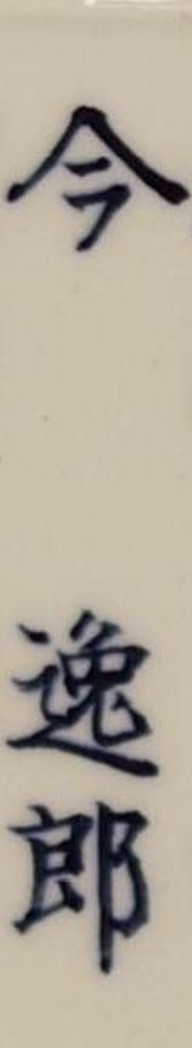今逸郎
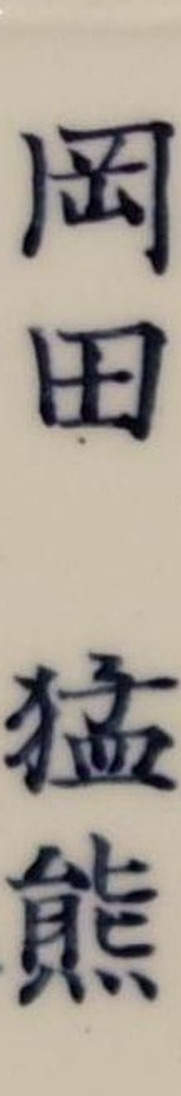岡田猛熊
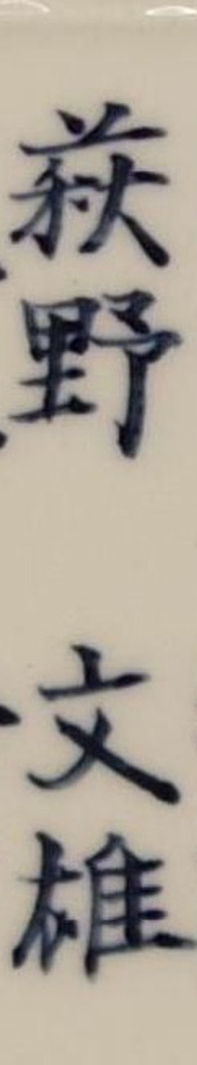萩野文雄
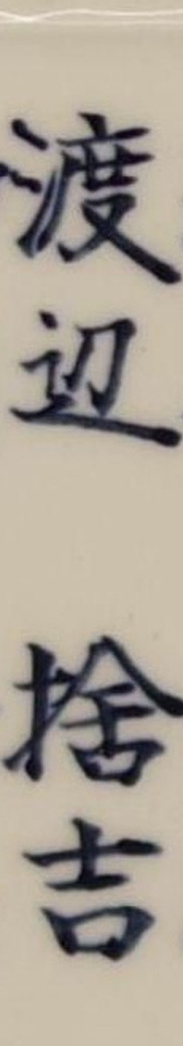渡辺捨吉
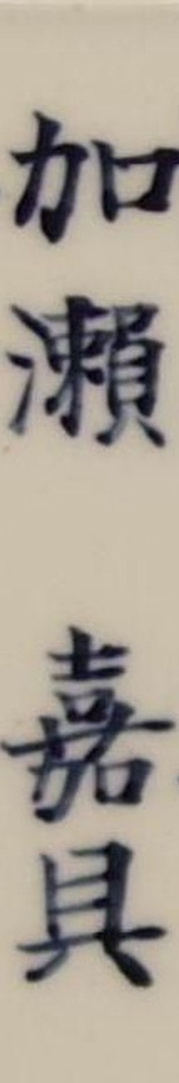加瀬嘉具
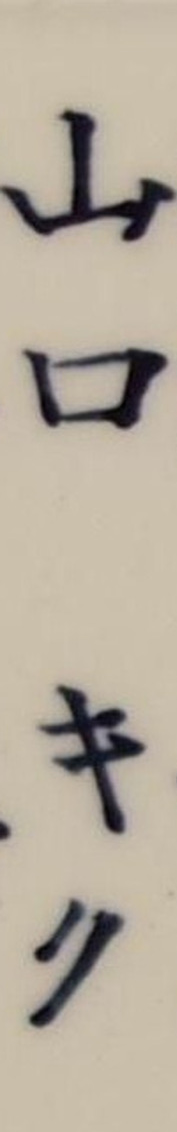山口キク
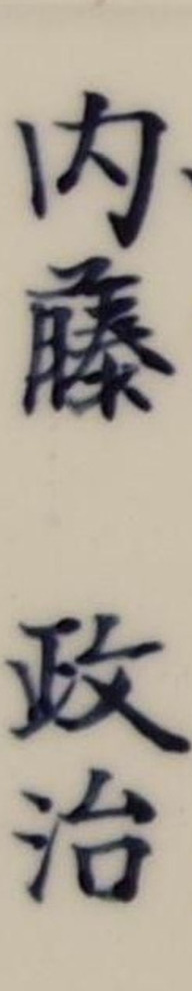内藤政治
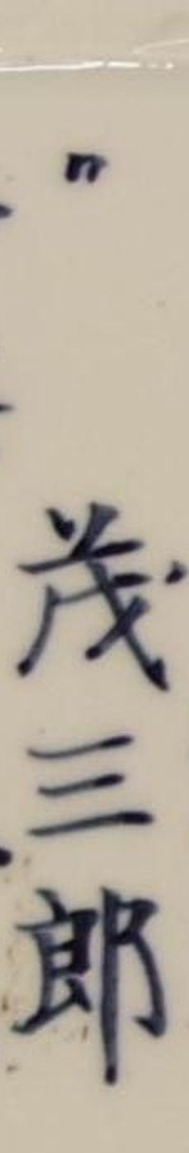茂三郎
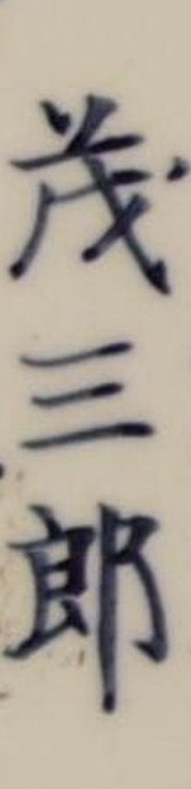茂三郎
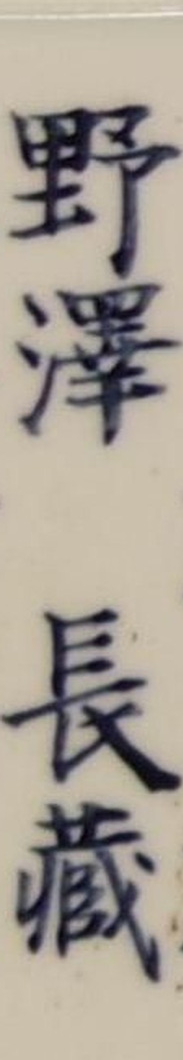野澤長蔵
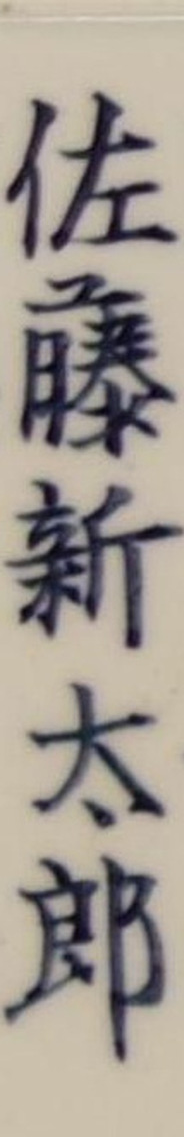佐藤新太郎
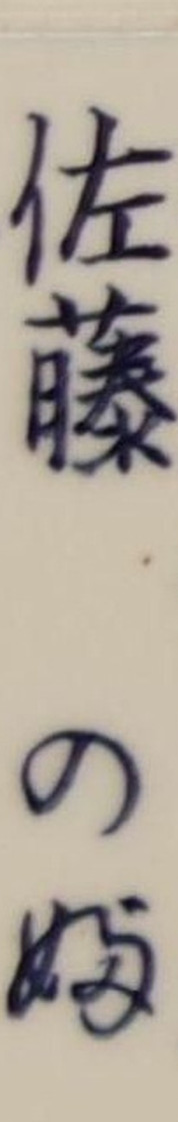佐藤のぶ
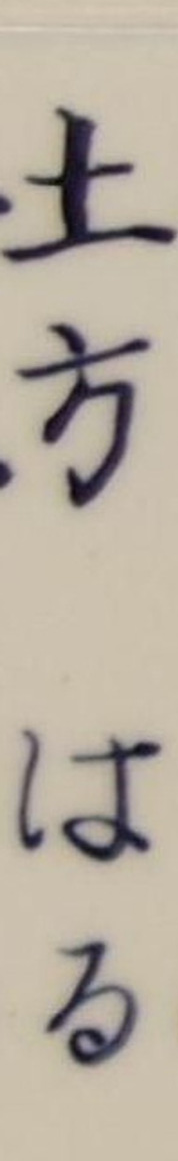土方はる
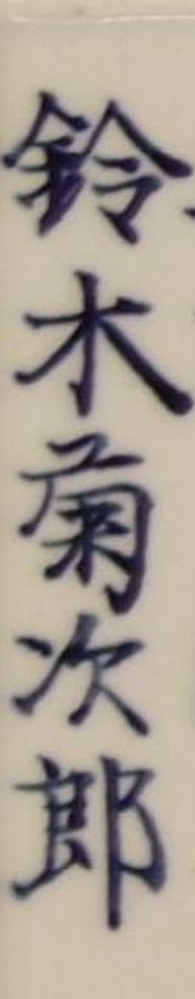鈴木菊次郎

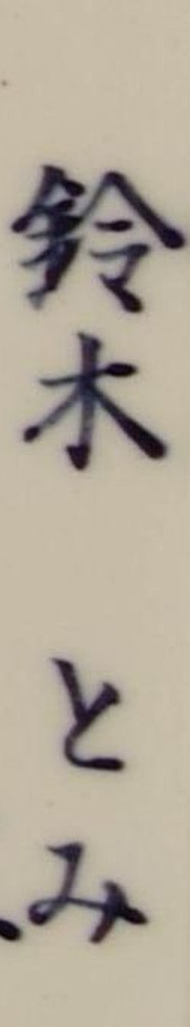鈴木とみ
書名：M~S
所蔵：高野山金剛峯寺
